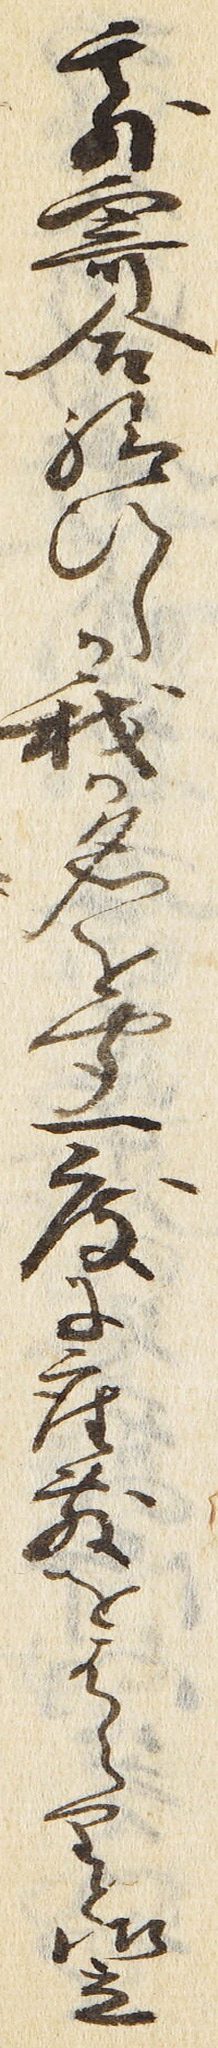其外寄合給ひしか我か名を聞一度に座敷をはらりと御立
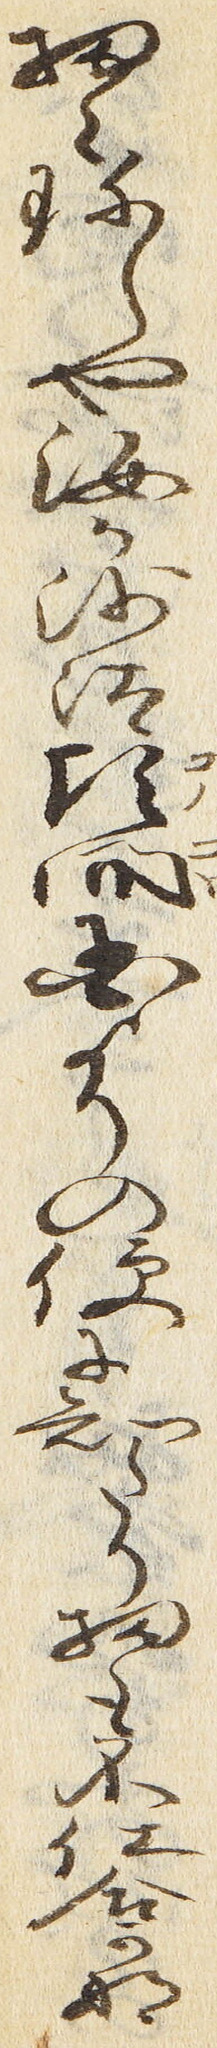扨々珎しや汝か沙汰頃間国よりの便に知たり扨も不仕合かな
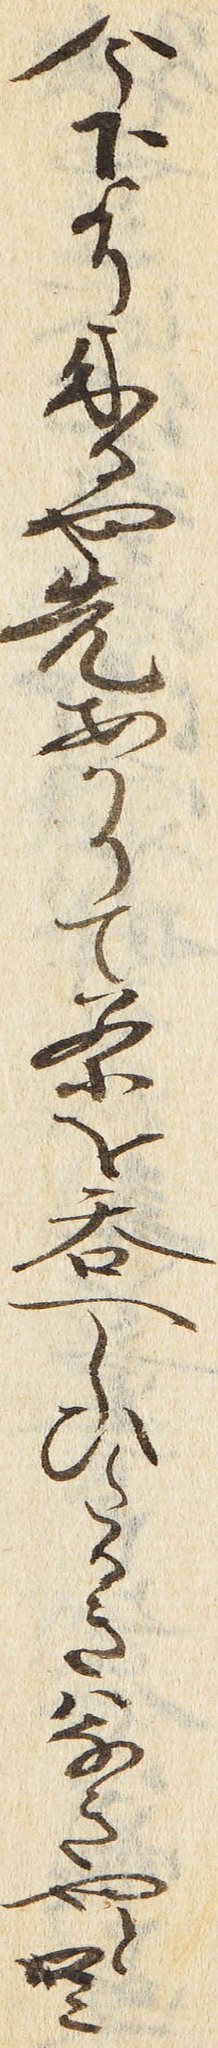今下より来るや先あかりて茶を呑へしひたるきはなきやと口々
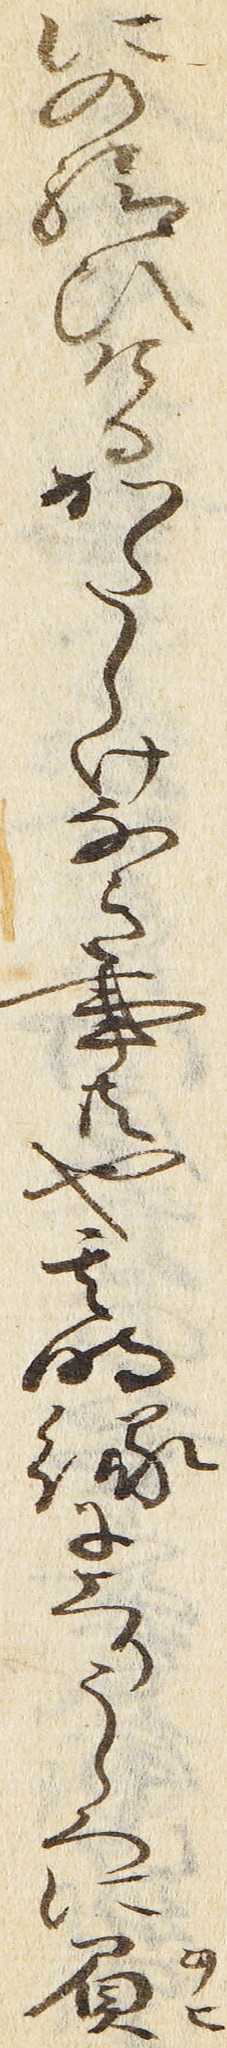にの給ひけるかたしけなき事共や其時縁に上りうしろに負
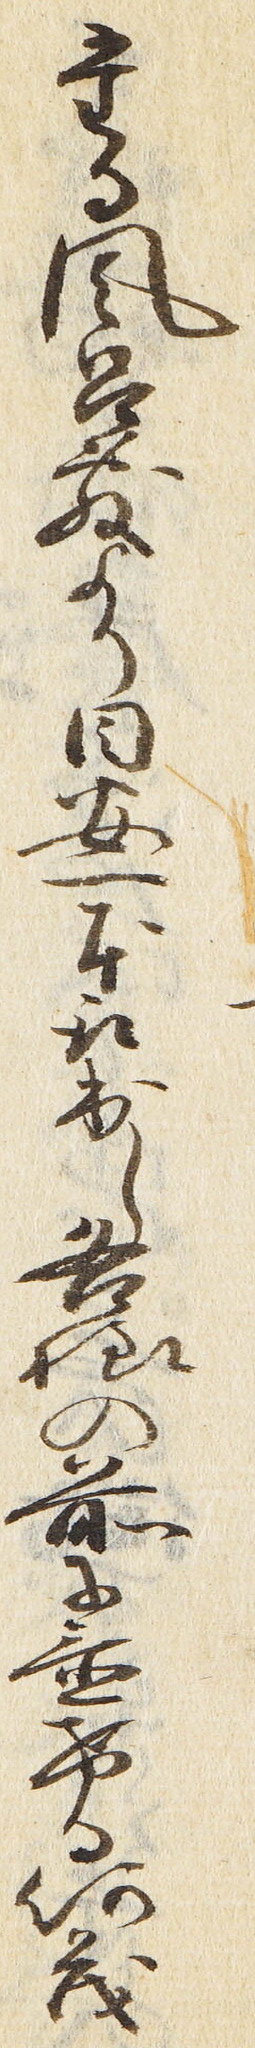たる風呂敷より目安一本取出し各様の前に置ける何も
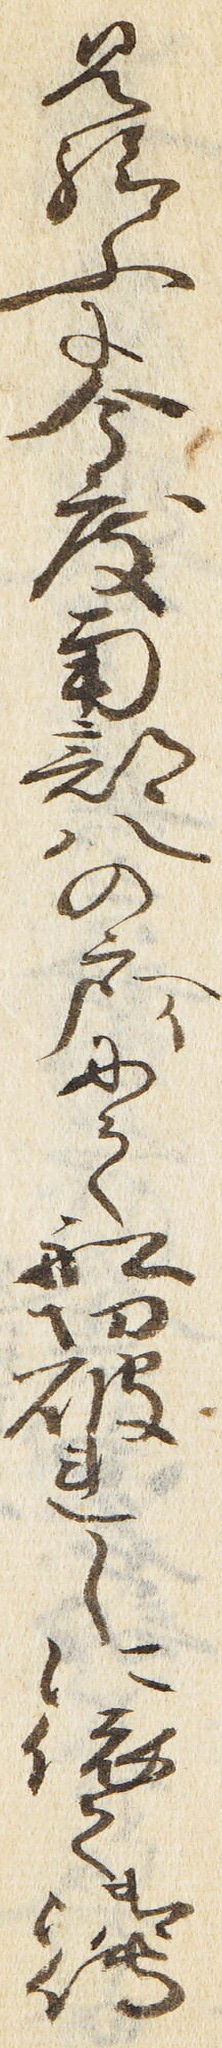見給ふに今度南部八の戸にて船切破れしに依て御伝
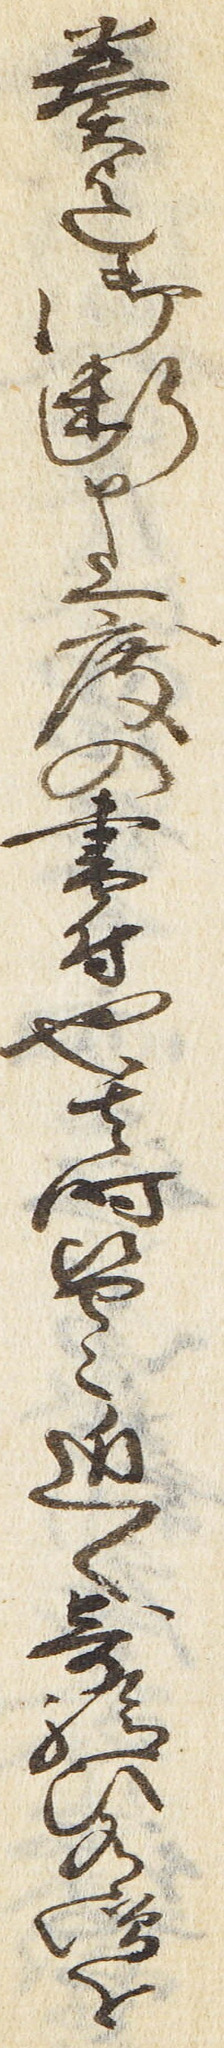奏迄御断申上度の書付也其時皆々近く寄給ひ有増を
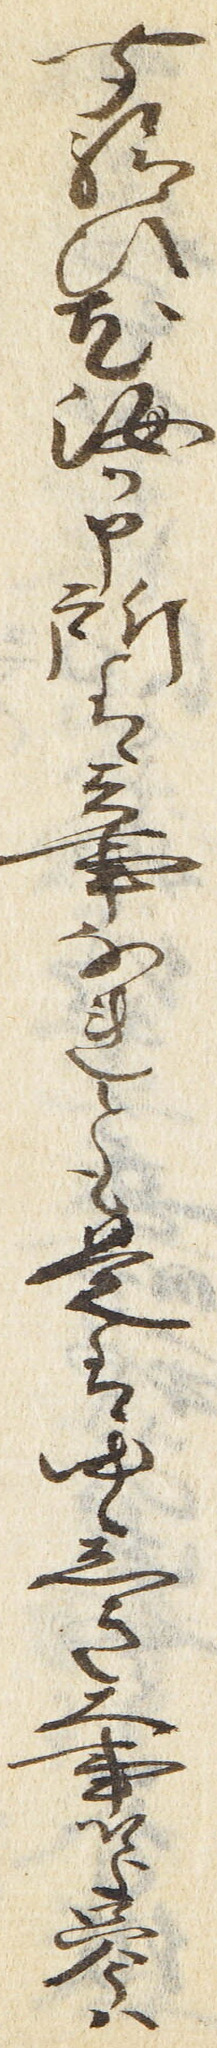聞給ひ尤汝か申所は去事なれとも是はゆゝしき大事そよ只今は
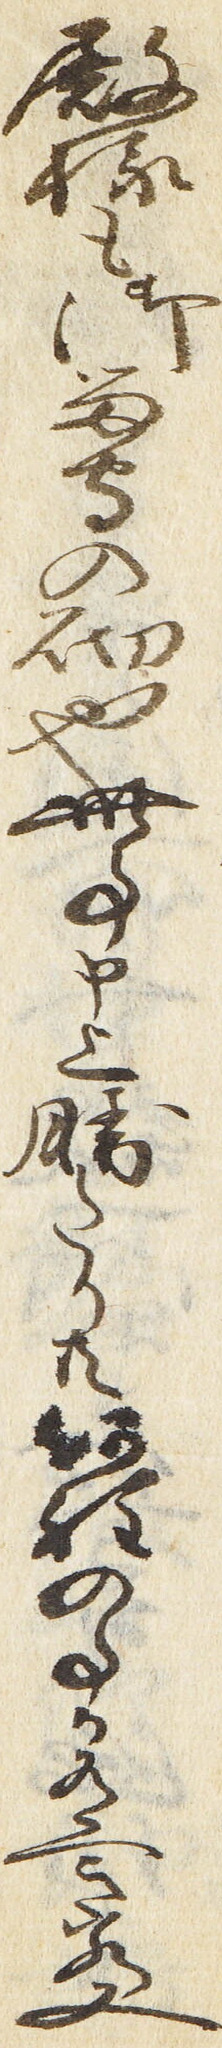殿様も御留守の砌也此事申上勝たり共何程の事か有へき若又
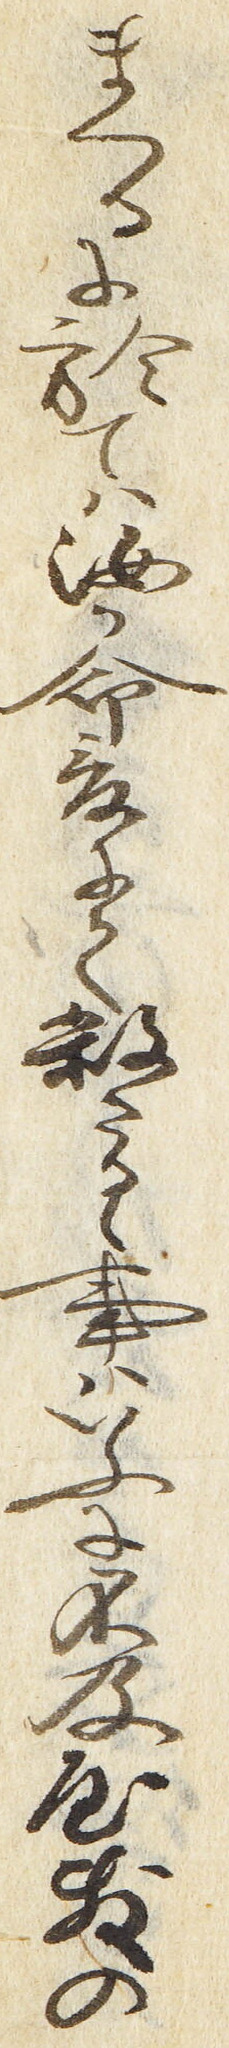まくるに於ては汝か命爰にて殺さるゝ事はいふに不及屋敷の
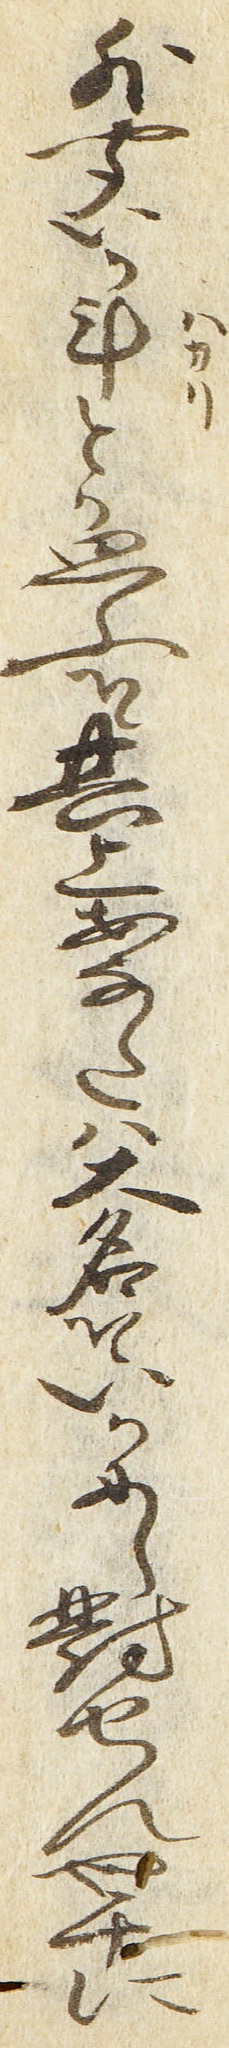外聞いか計とか思ふそ其上あなたは大名そいかに対せんや十に

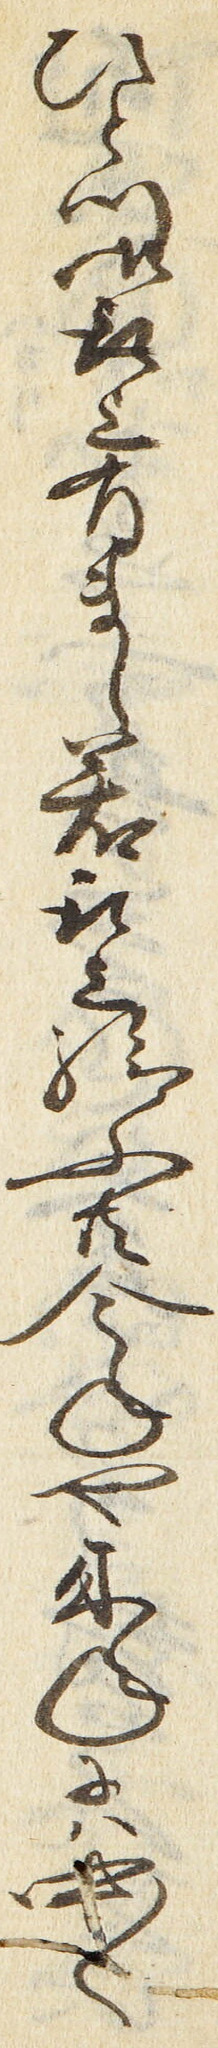ひとつ御取上有まし若取上給ふ共今年や来年には中〳〵
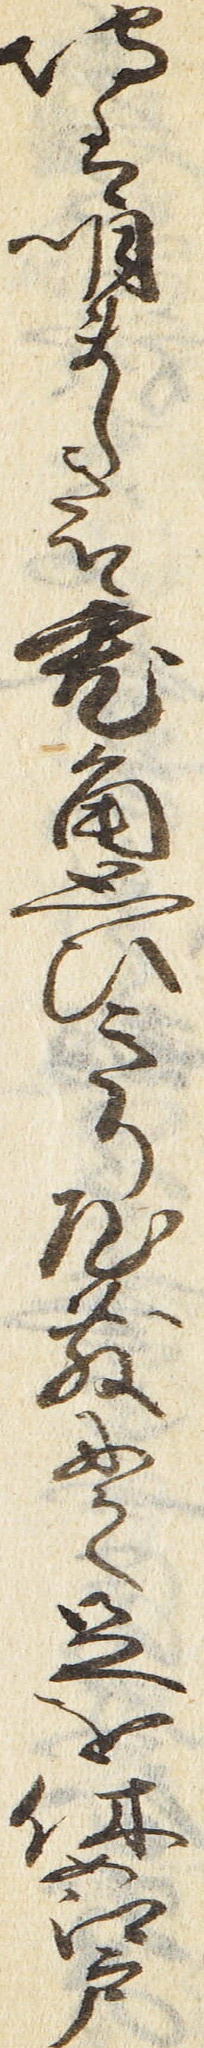埒は明ましきそ兎角思ひきり屋敷にて足を休め江戸
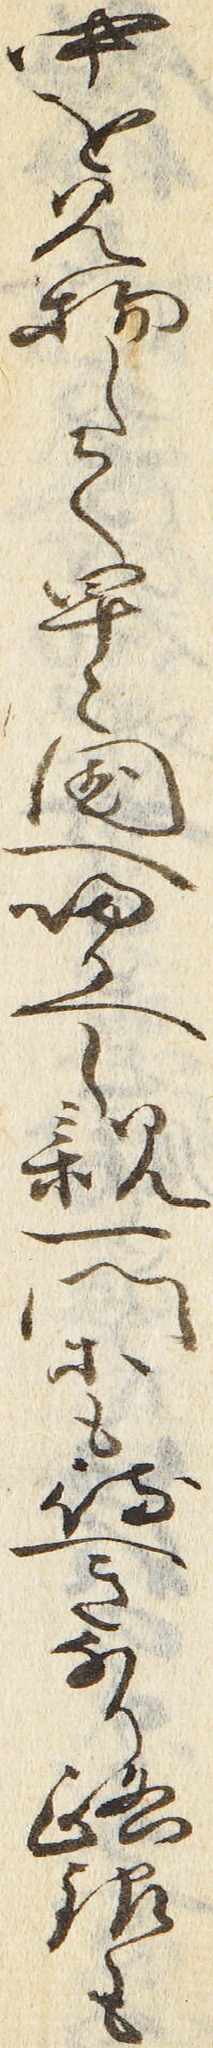中を見物して早々国へ帰るへし親一門等も待へきなり路銀も
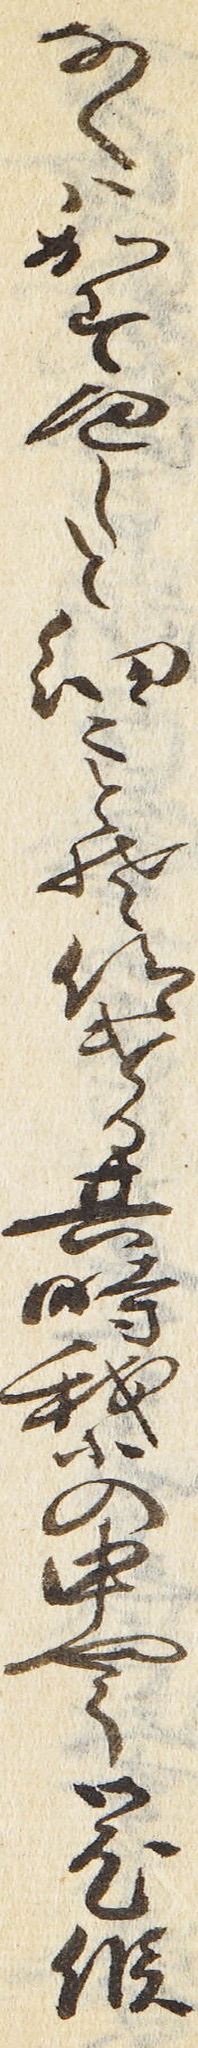なくはかすへしと細々とそ仰ける其時我等の申やう御尤候
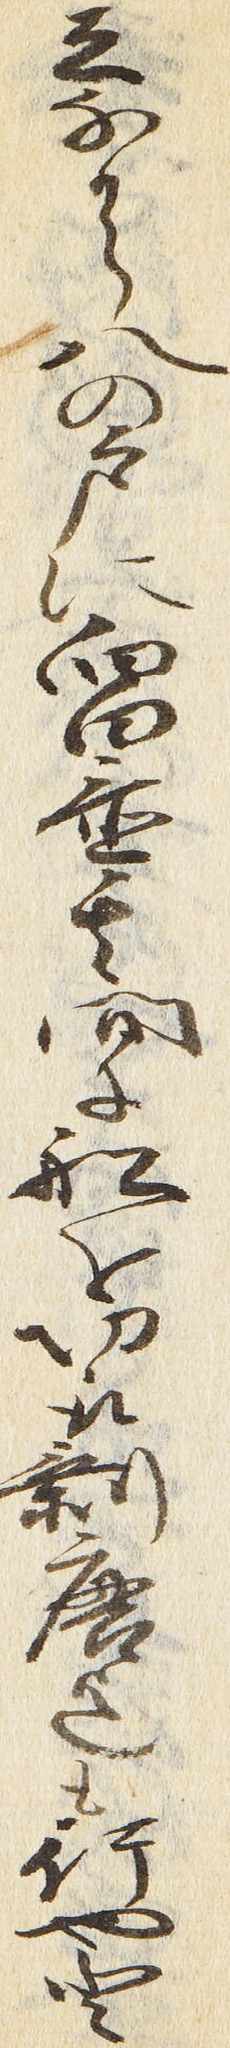去なから八の戸に留置其間に船を切取剰唐迄も行やと
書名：海陸世話日記
